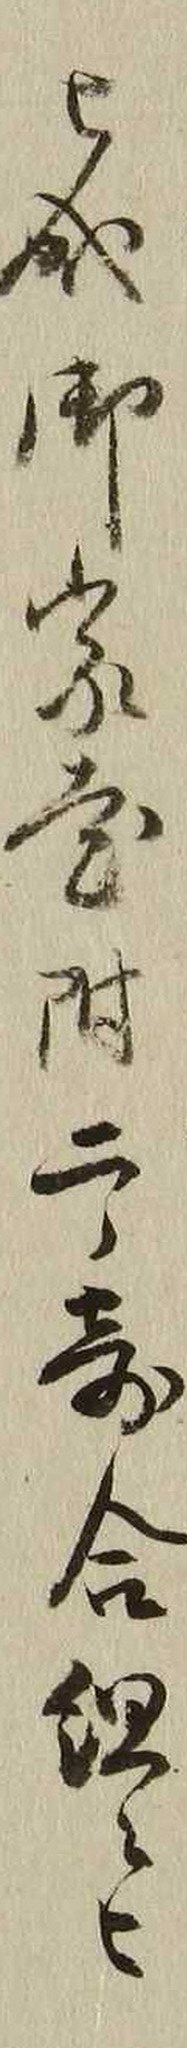被成御家老附二ノ寄合組ニ被
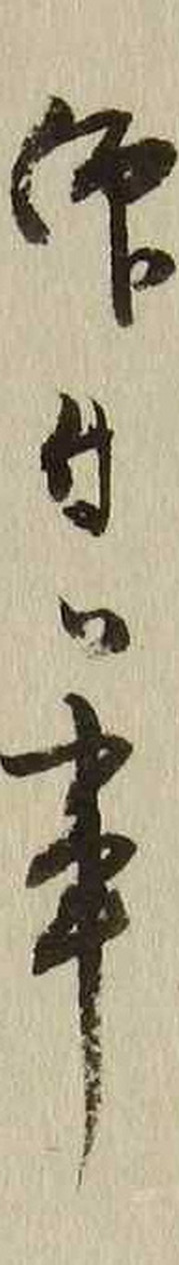仰付候事
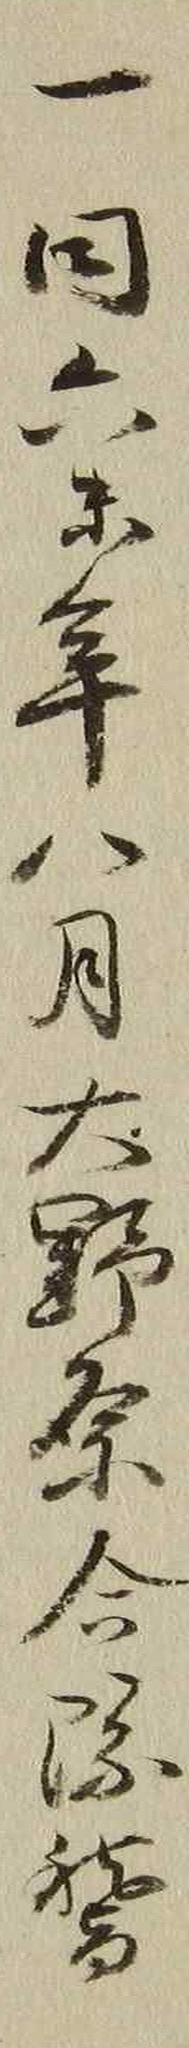一同六未年八月大野原合隊稽
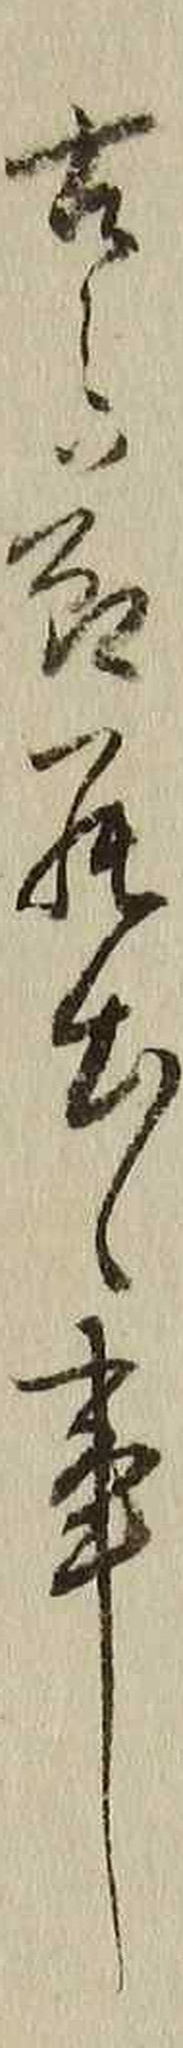古之節罷出候事
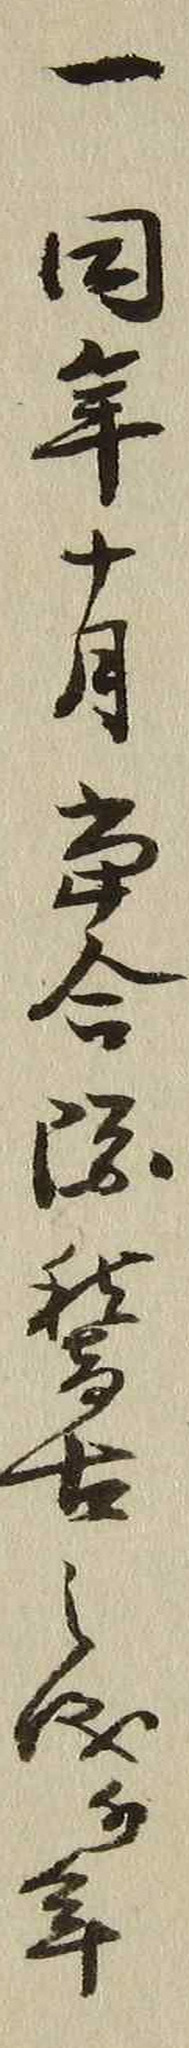一同年十月当合隊稽古之儀卯年
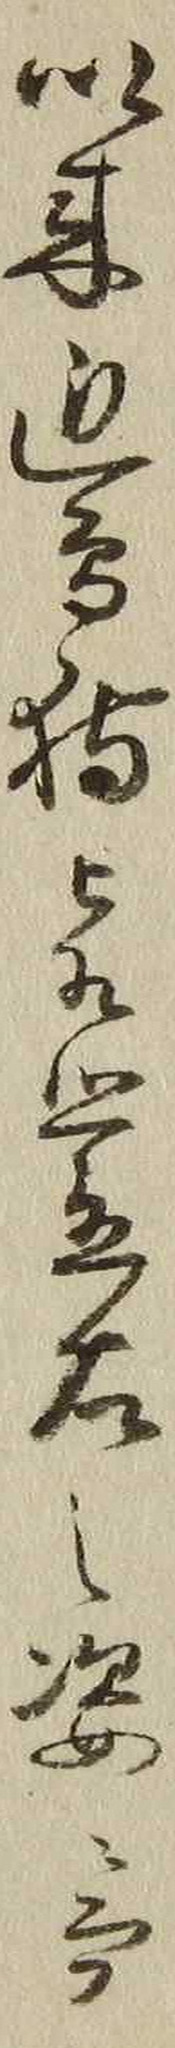以来追鳥狩被相止置右之姿ニ而
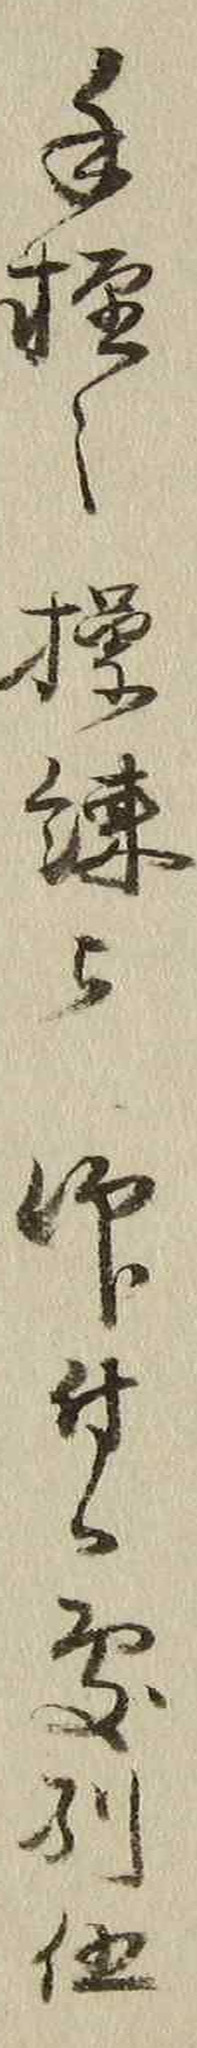手軽之操錬被仰付候処列伍
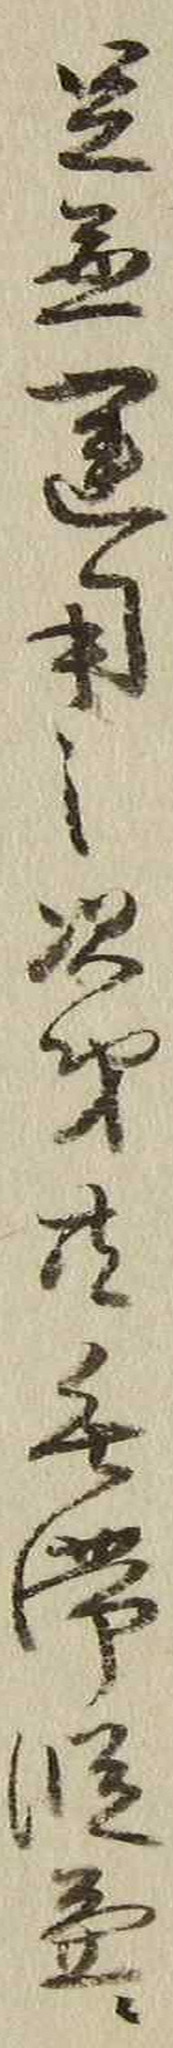足並運用之次第共無滞段兼々
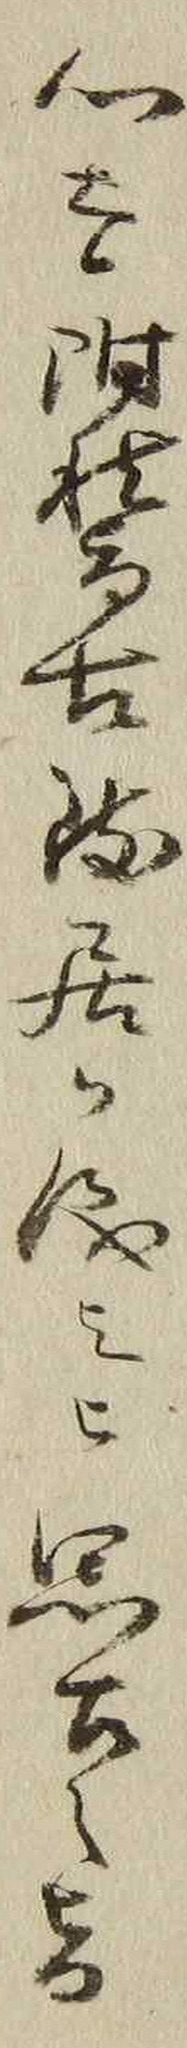心を附稽古致居候儀と被思召之旨
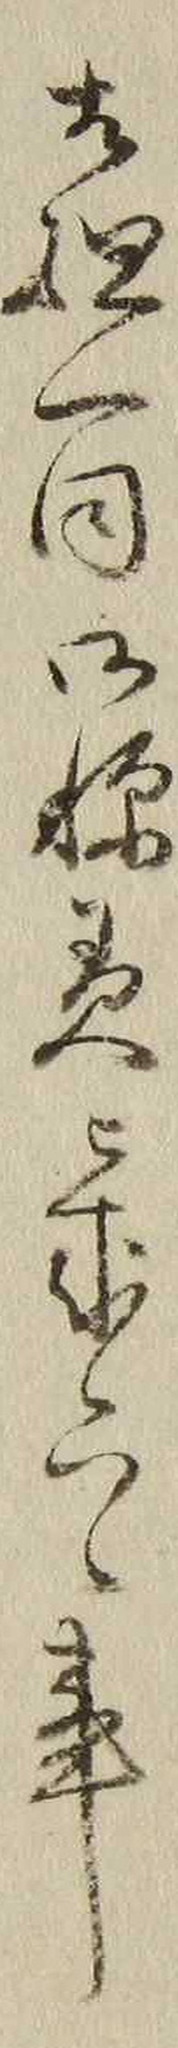相組一同御称美被成下候事
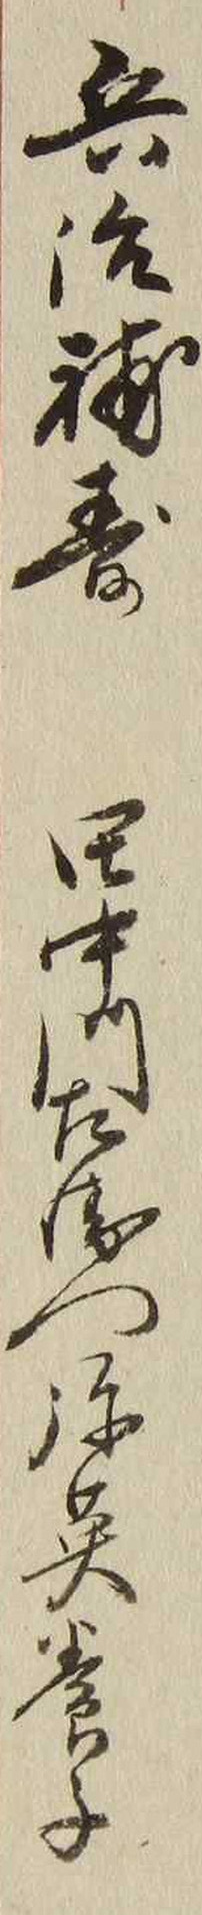兵治補寿田中門左衛門弥英養子

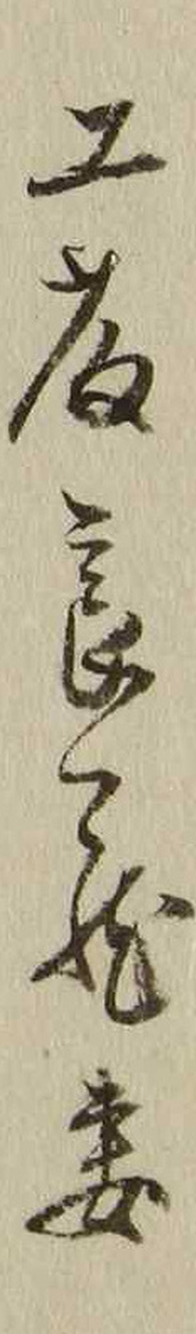工藤良蔵妻
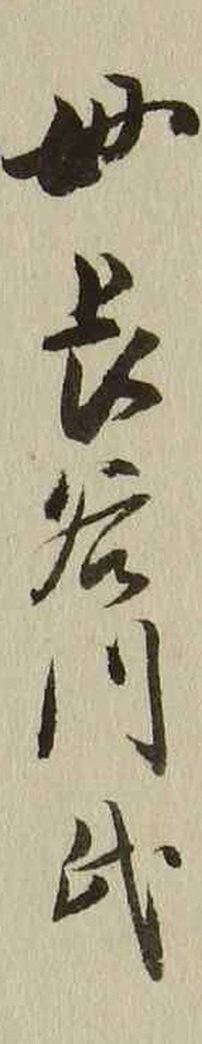母長谷川氏
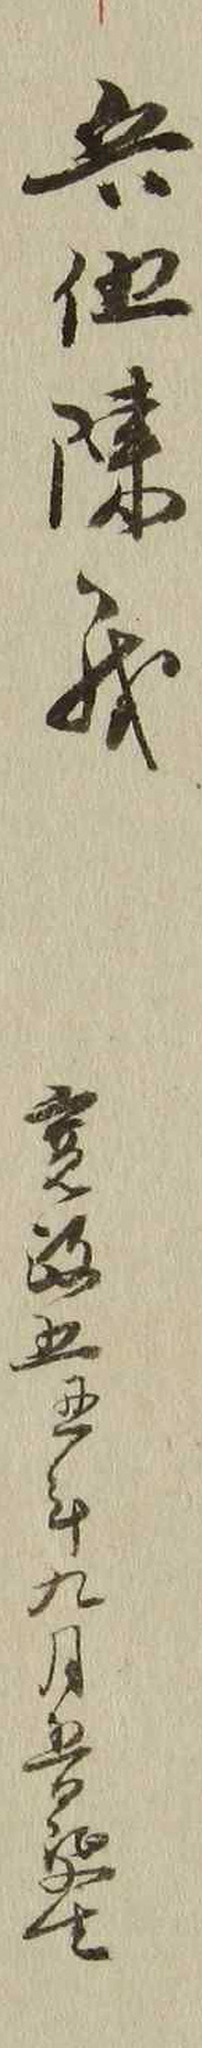兵伍陳義寛政五丑年九月五日誕生
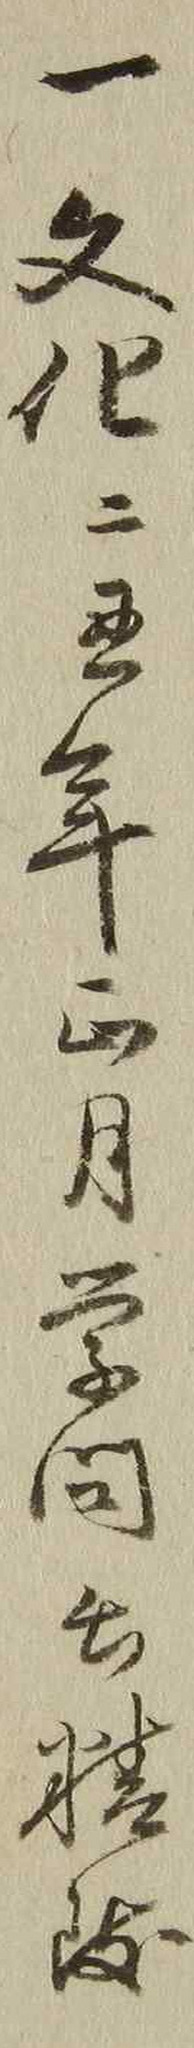一文化二酉年正月学問出精致
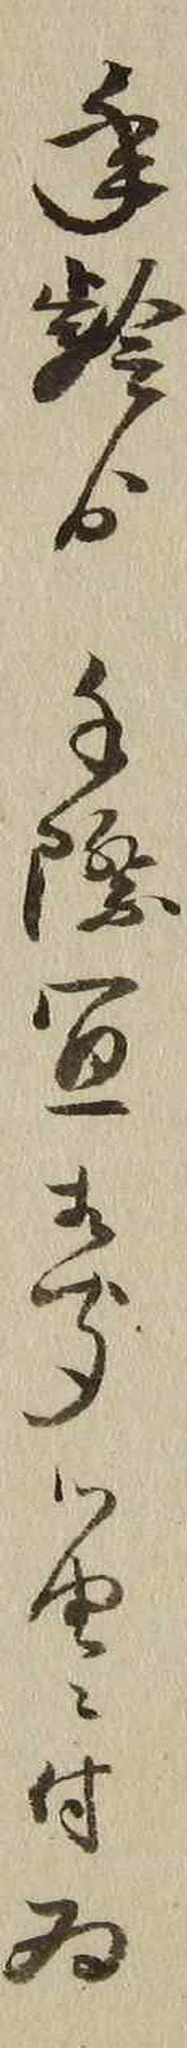年齢ゟ手際宜相聞候由ニ付為
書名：諸士系譜　巻之236　ふ之部4
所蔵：会津若松市立会津図書館
